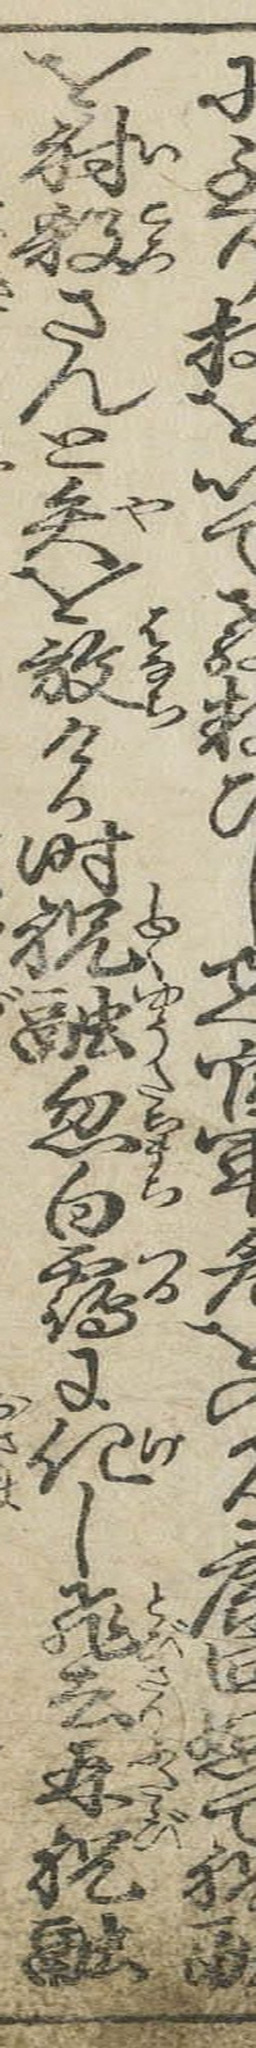を射殺さんと矢を放ける時祝融忽白鶴に化し飛去再祝融

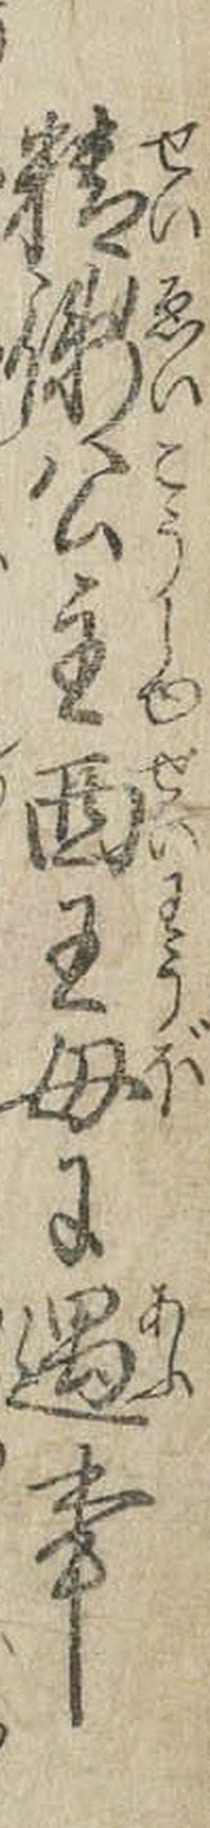精衛公主西王母に遇事
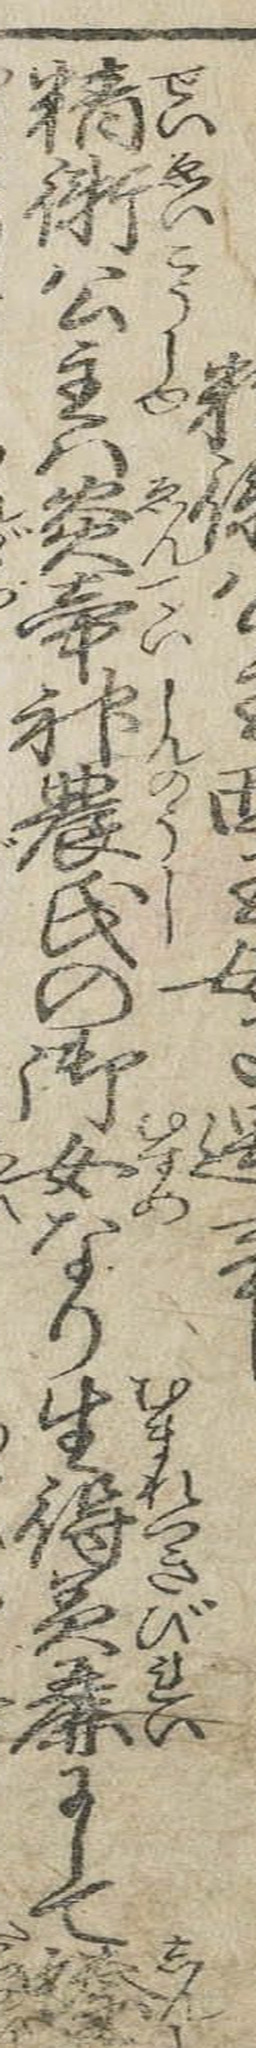精衛公主は炎帝神農氏の御女なり生得美麗にして螓首
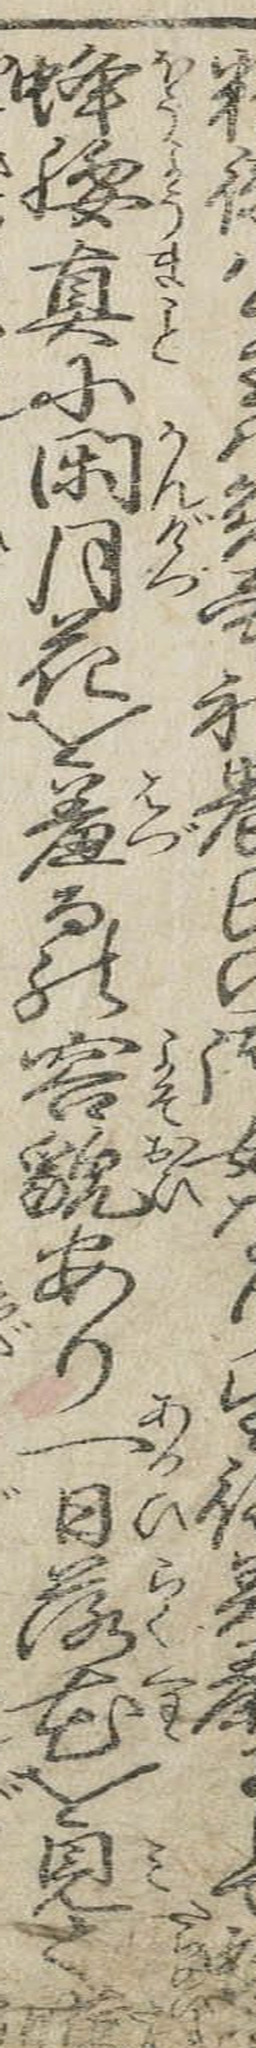蜂腰真に閑月花を羞るの容貌あり一日落花を見て嘆
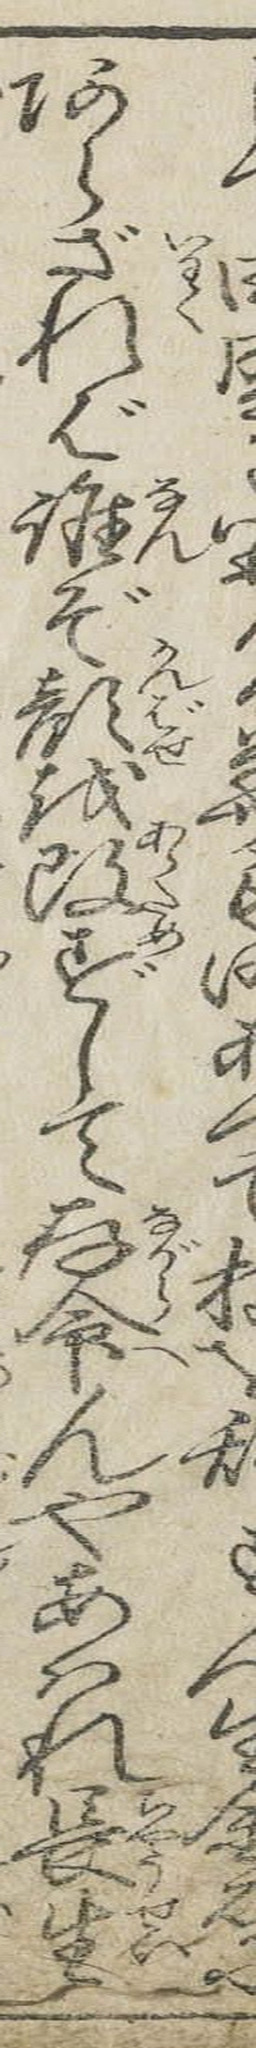あらざれば誰ぞ顔を改ずして存命んやあはれ長生
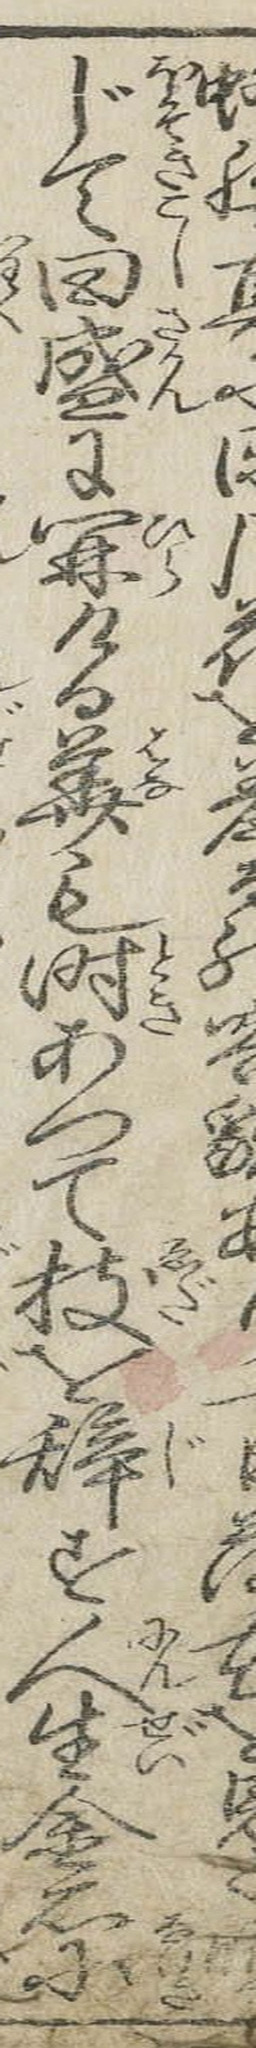じて曰盛に開ける華も時あつて枝を辞す人生金石に
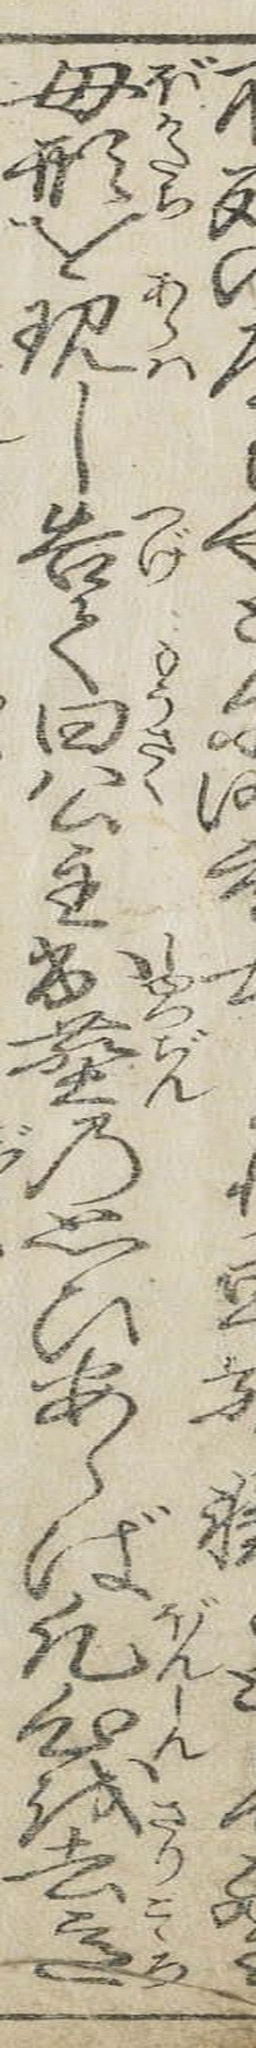母形を現し告て曰公主出塵の思ひあらば凡心を去意
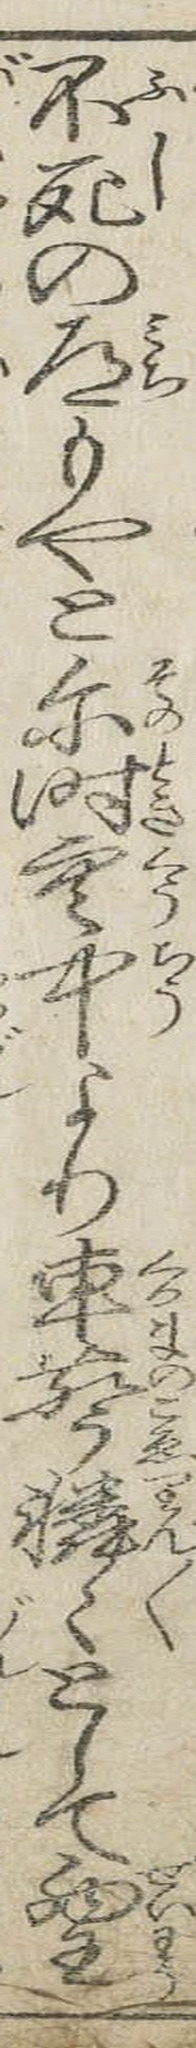不死の道もやと爾時空中より車声轔々として西王
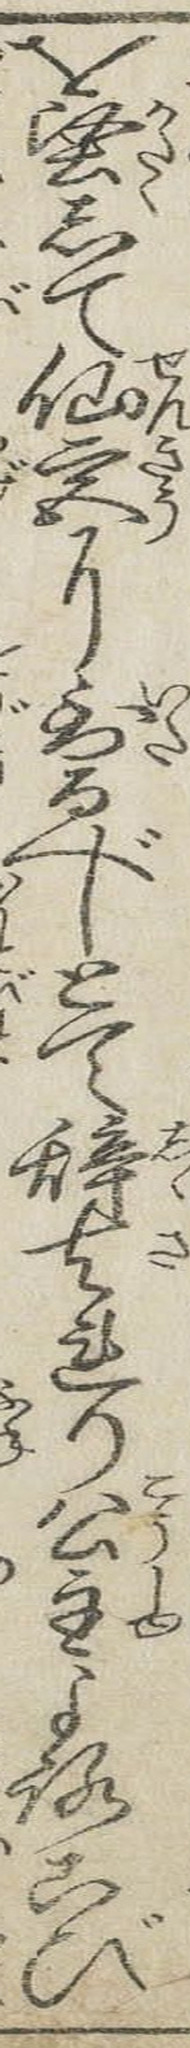を堅して仙宮に至るべしとて辞去れり公主よろこび
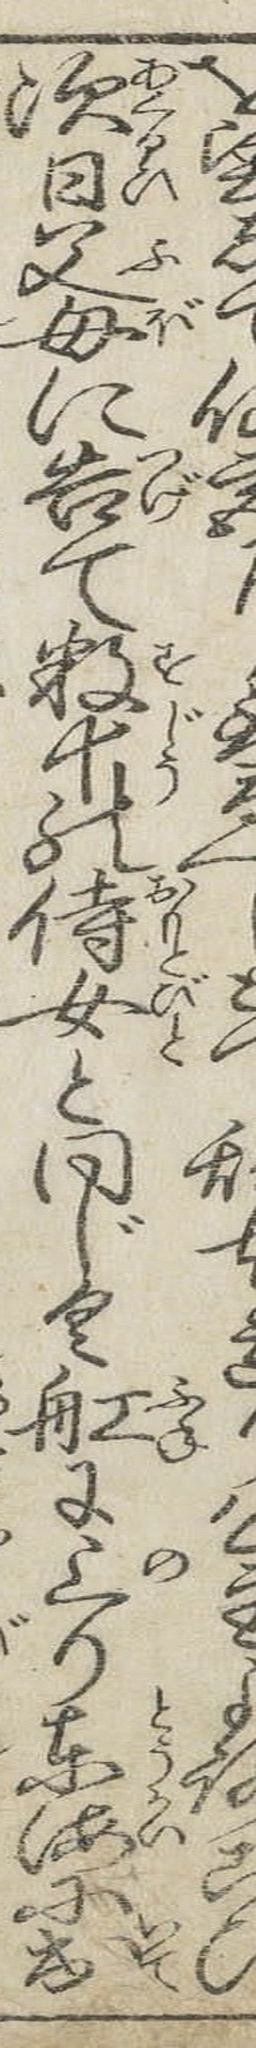次日父母に告て数十の侍女と同じく船に上り東海に出
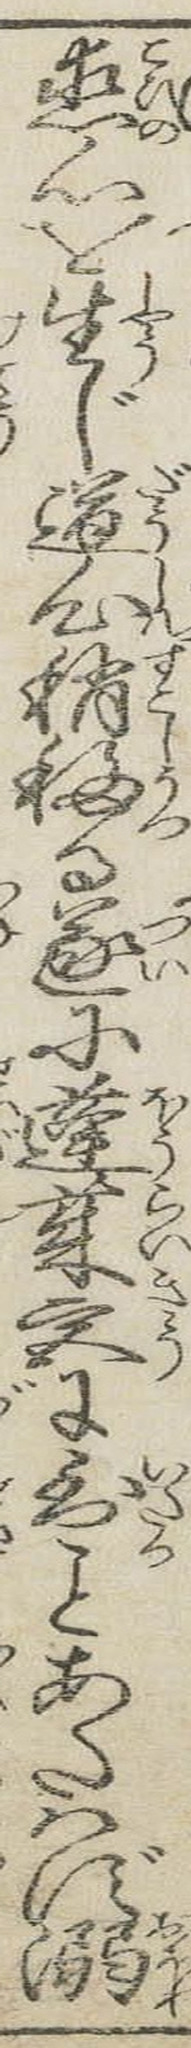恋心を生じ道心稍移る遂に蓬莱宮に至ことあたはず溺
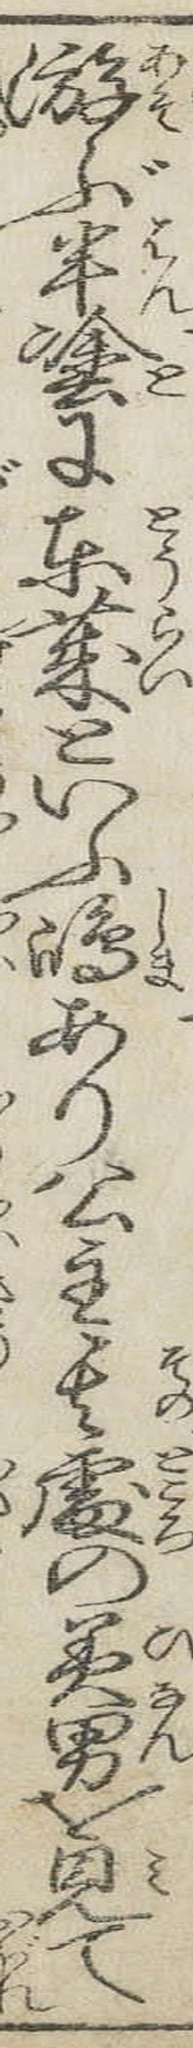游ぶ半塗に東莱といふ島あり公主其処の美男を見て
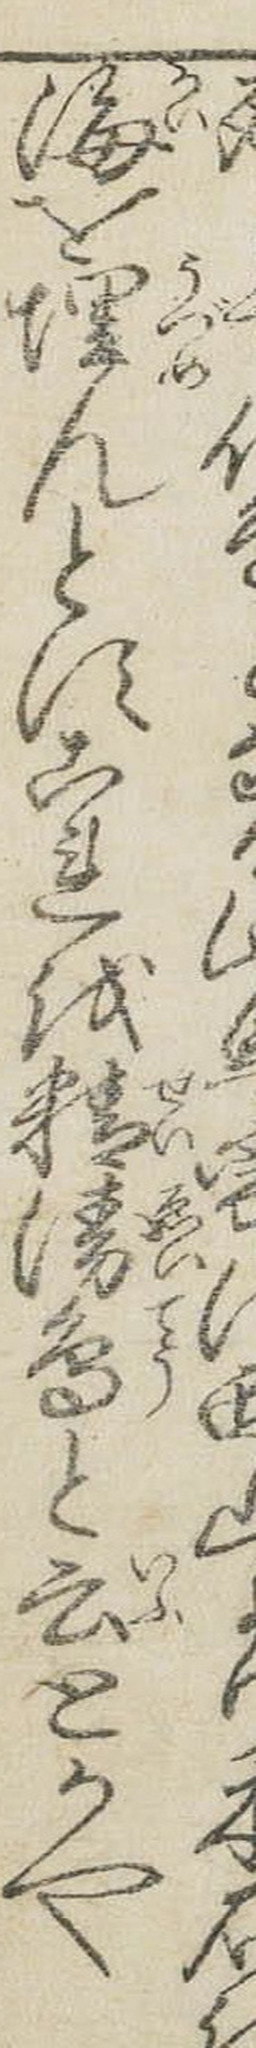海を埋んとすこれを精衛鳥と云とかや
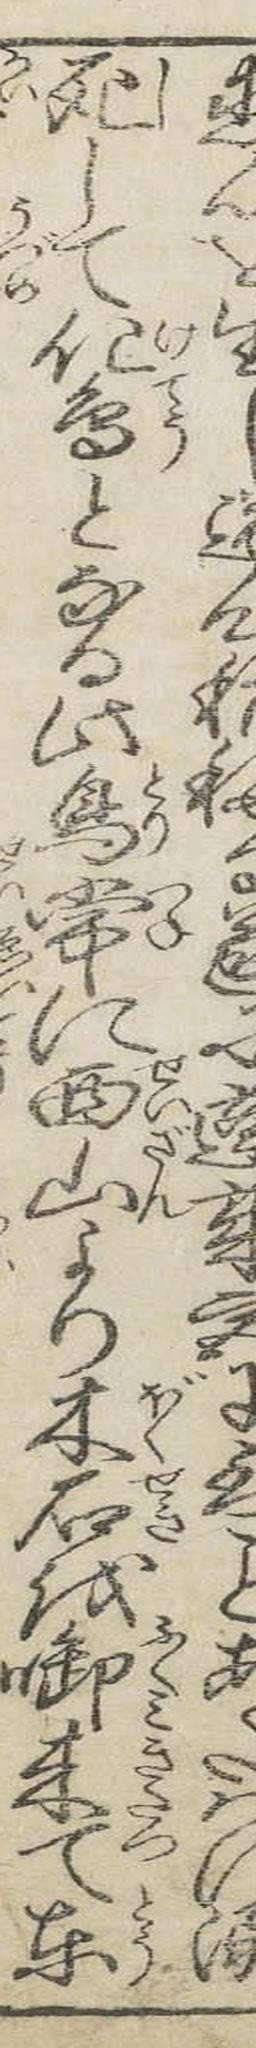死して化鳥となる此鳥常に西山より木石を銜来て東
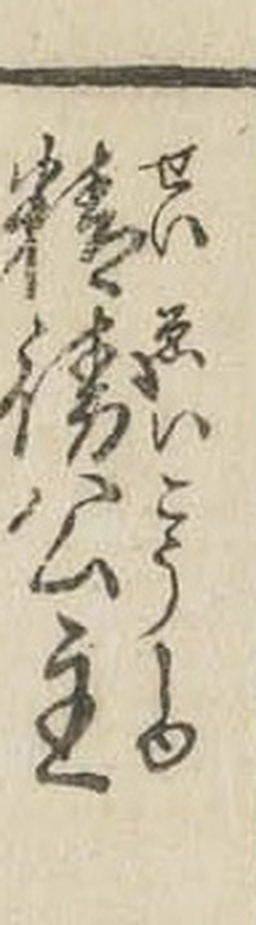精衛公主
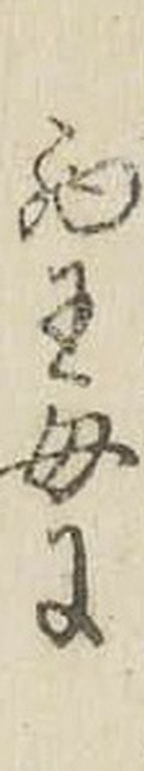西王母に
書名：絵本写宝袋 9巻 4之巻
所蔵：東京学芸大学教育コンテンツアーカイブ
